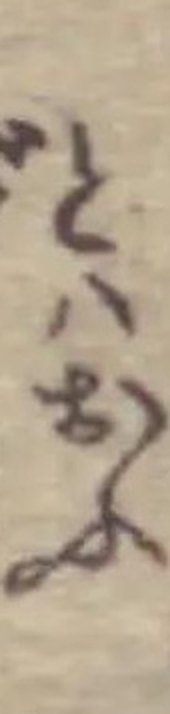とはおふ
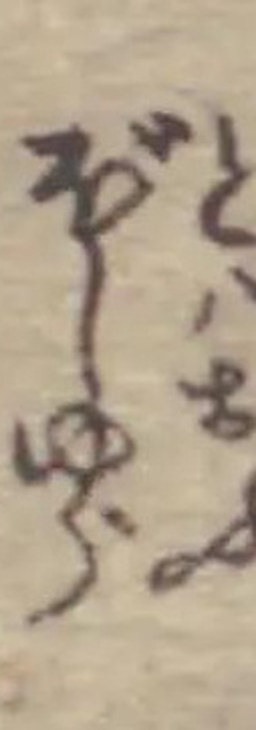ぼしゆら
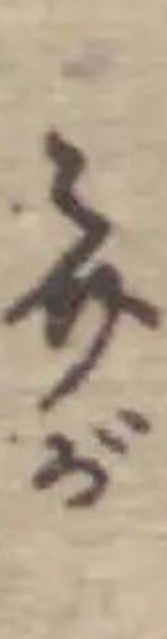之介が
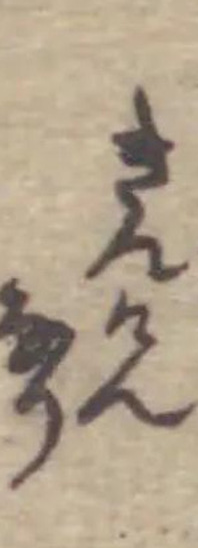きんけん
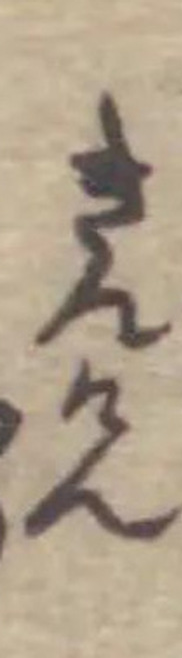きんけん

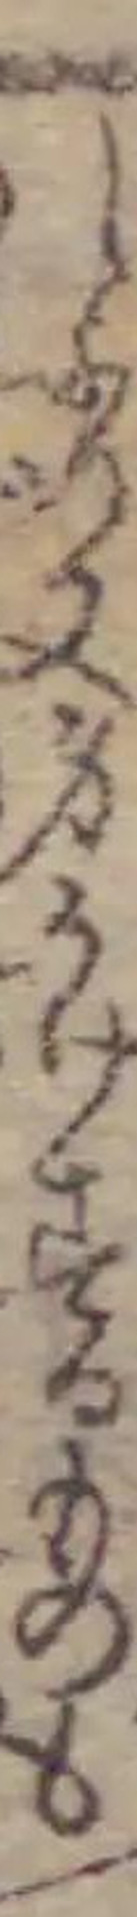しより又身うけするものも
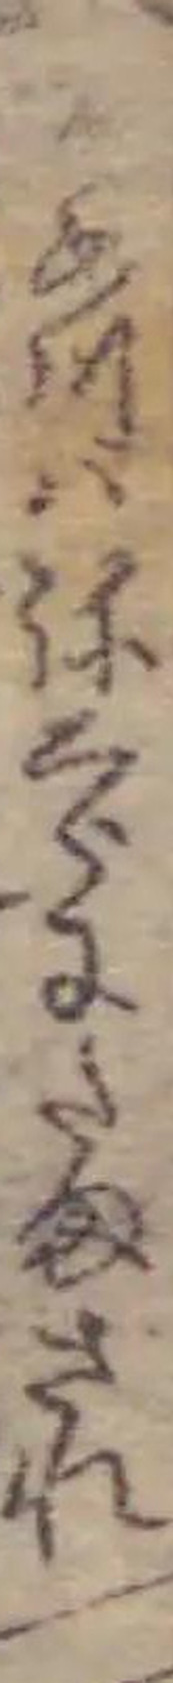染川は弥二郎にたまされ
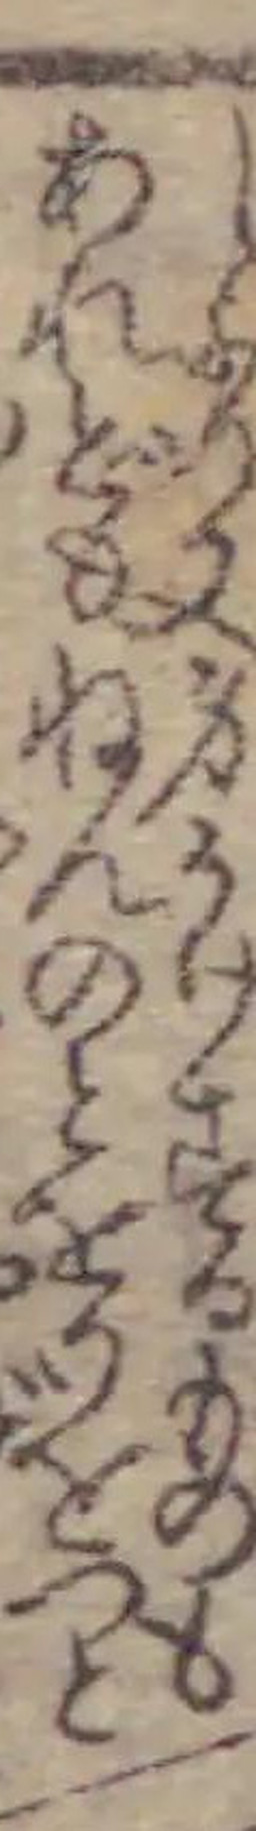あれどもねんのとをりをつと
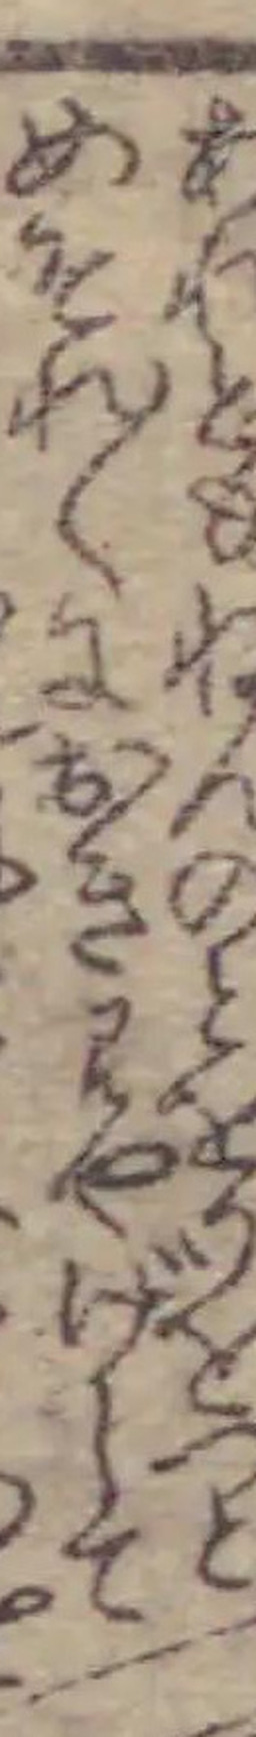めそれ〳〵におきみやげして
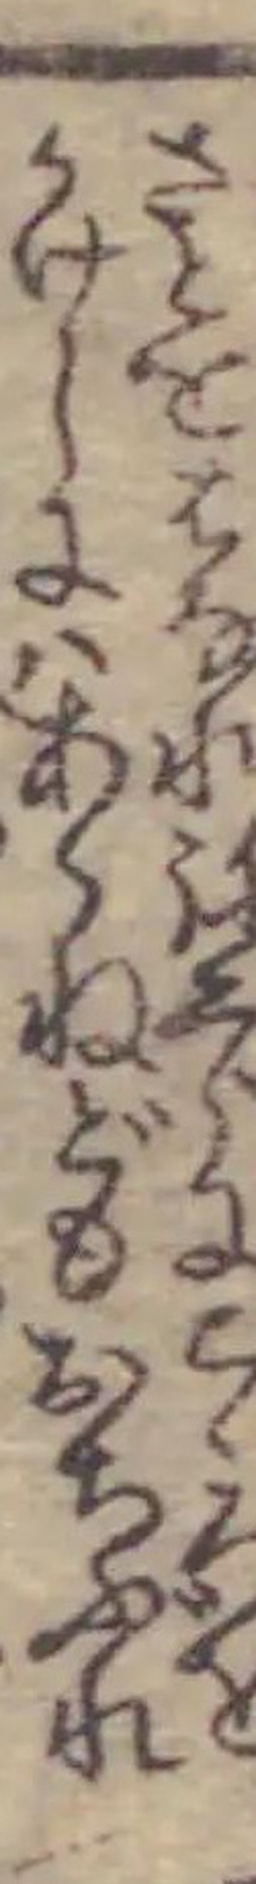かけしにはあらねどもおちぶれ
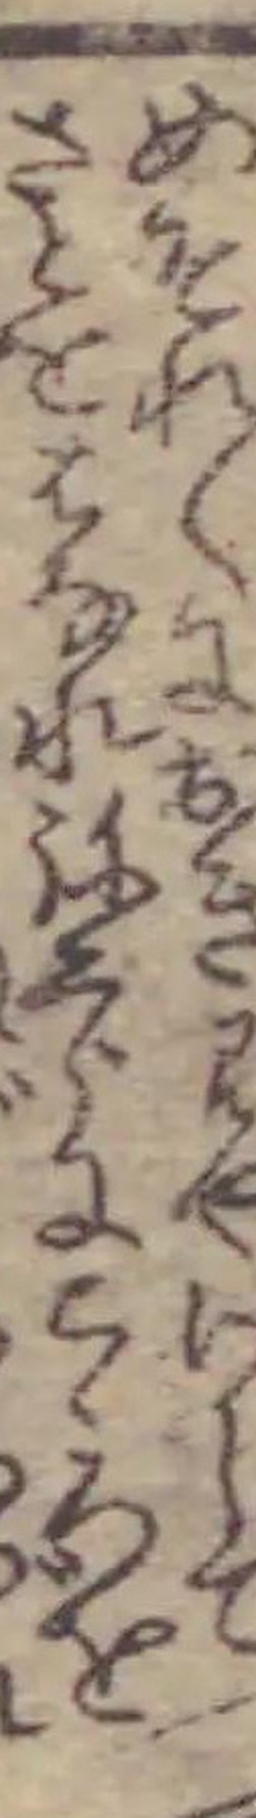さとをはなれ弥二郎にこゝろを
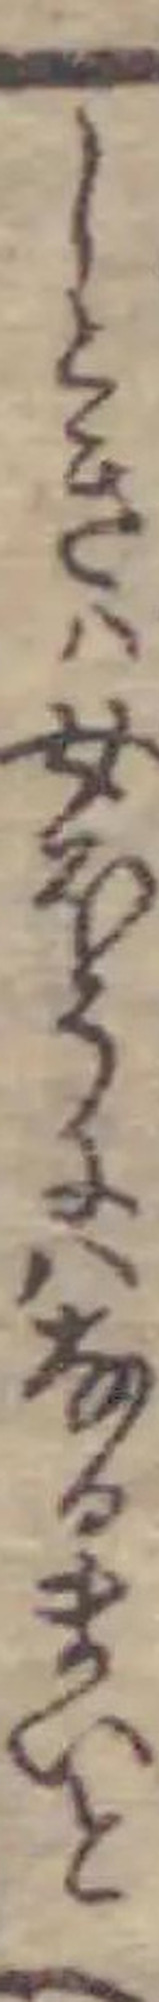しときは女ほうにはなるまいと
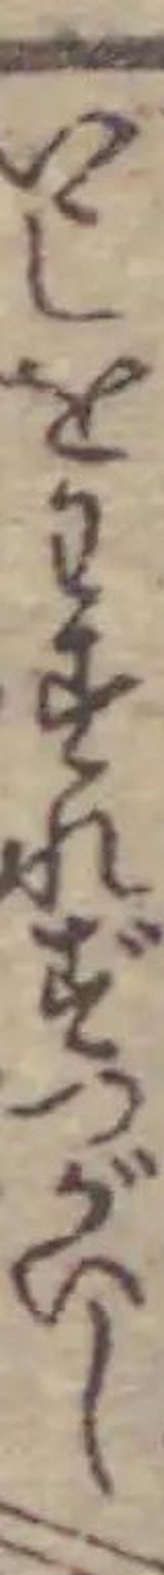いゝしをわすれずつがいし
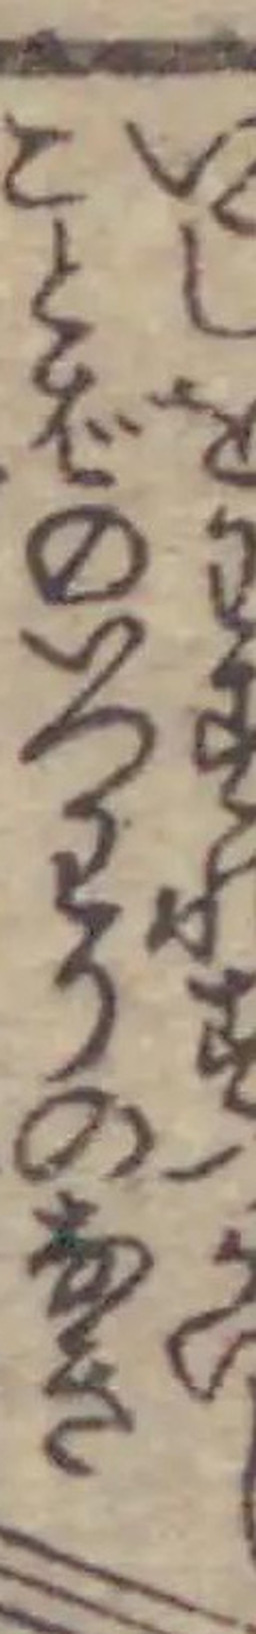ことばのいつわりのなき
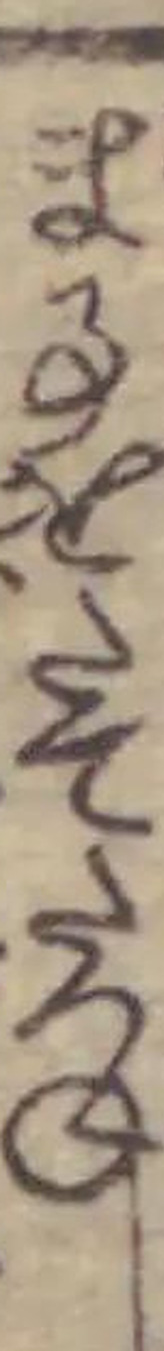ま事をたてたつね
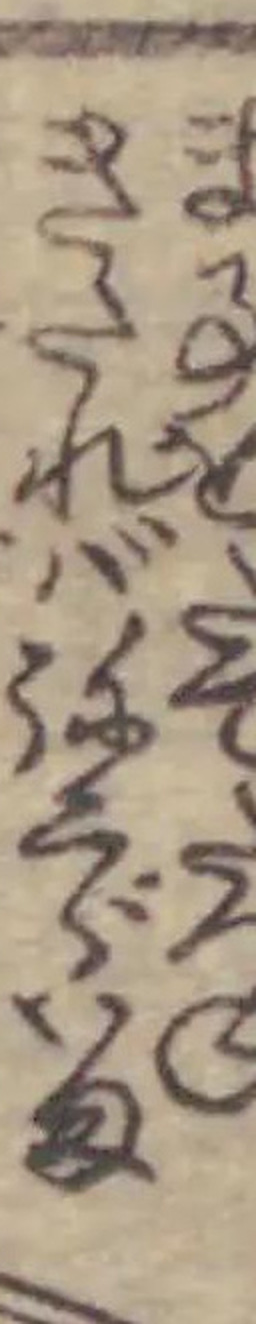きたれば弥二郎いま
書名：虚言弥二郎傾城誠 3巻
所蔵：国立国会図書館 National Diet Library, JAPAN
